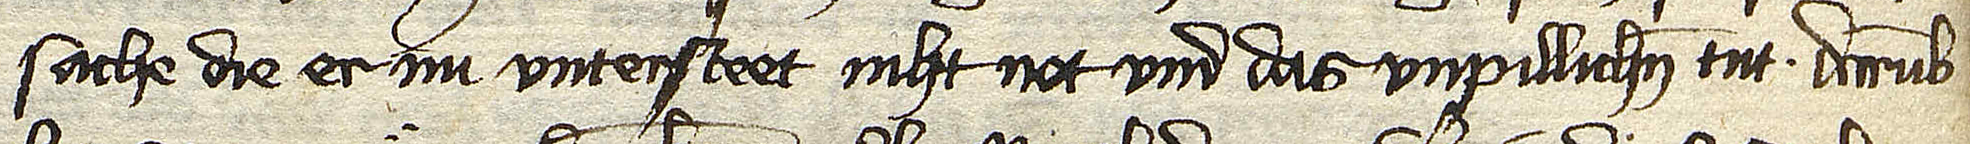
ſache die er nu vnterſteet niht not vnd das vnpillichn* tut . Darub*
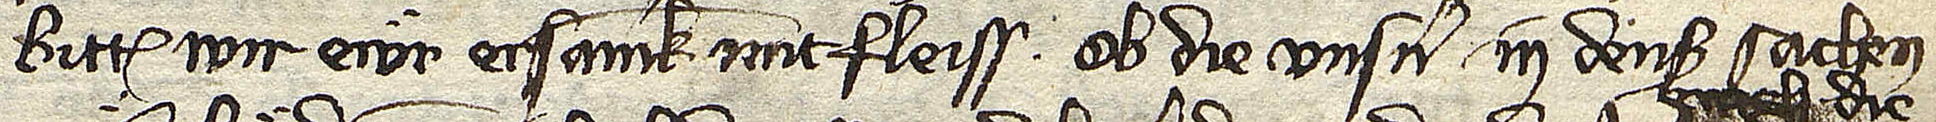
bitt* wir eẅr erſamk* mit fleiſſ . Ob die vnſn* / in denſ* ſachen
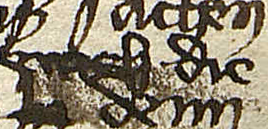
ewch die
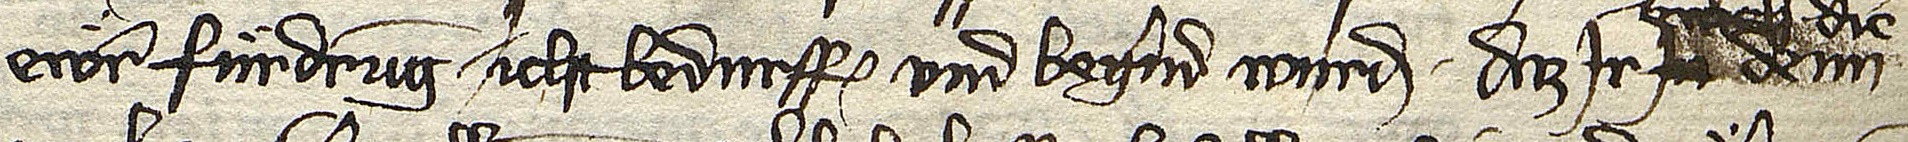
eẅr* fürdru*g icht bedurff* vnd bege*nd wurd* / daʒ ir In denn
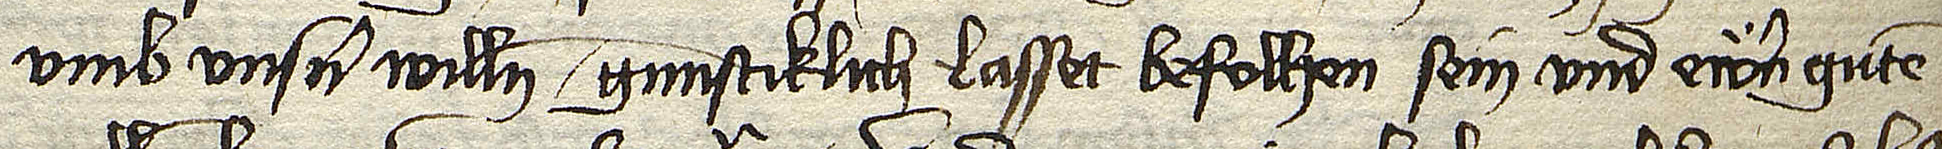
vmb vnſn* willn* / gunſtiklich laſſet befolhen ſein vnd eẅ*n gute*
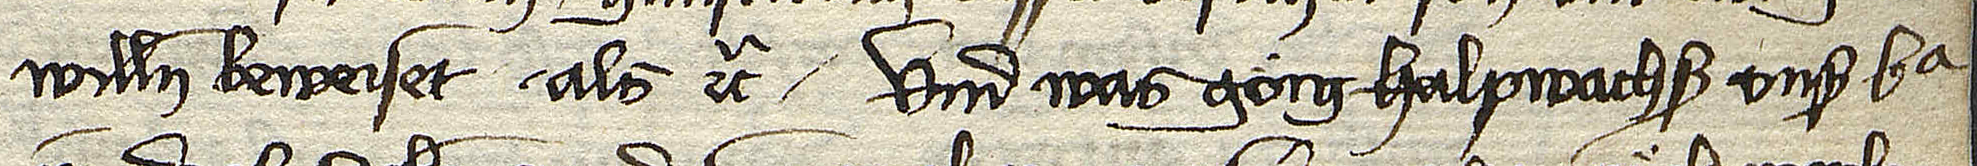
willn* beweiſet / als ec* / Vnd was görg halpwachſ* vnſ* b*
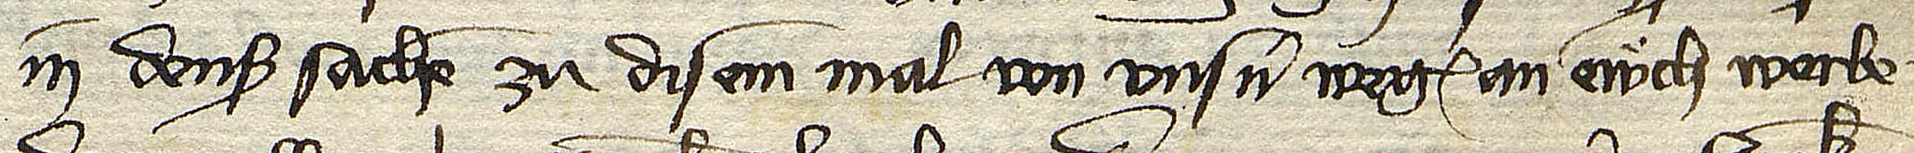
in denſ* ſache* ʒu diſem mal von vnſn* weg* an eẅch werbe .
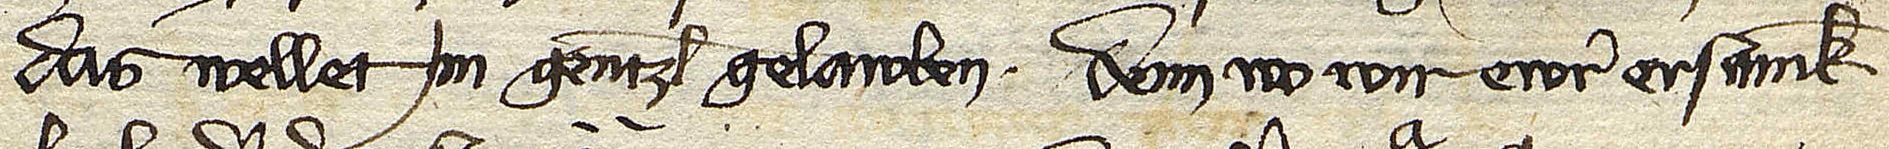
Das wellet Im gencʒl* gelawben . Denn wo wir ewr* erſamk*
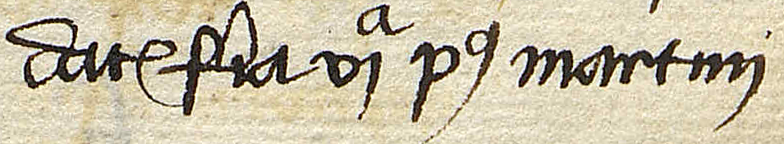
dat* fi*a vi* p* martini
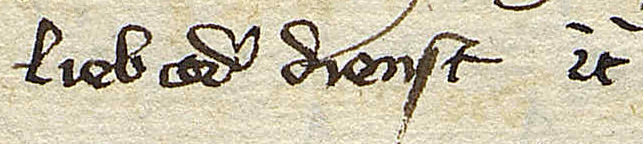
lieb od* dienſt ec*
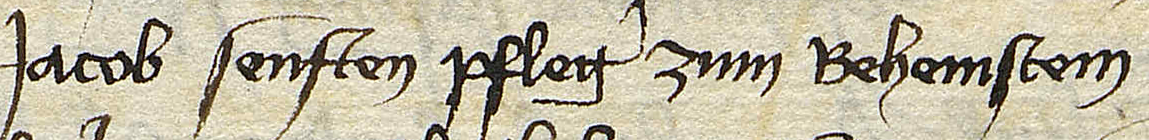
Iacob ſenften pfleg* ʒum Beheimſtein
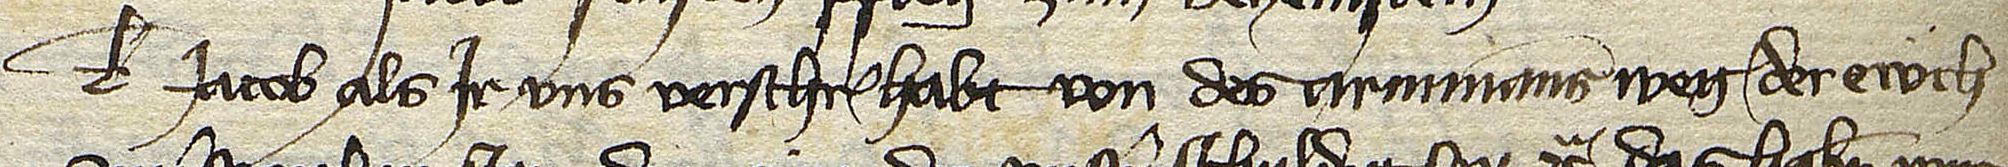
L* Iacob als Ir vns verſchr* habt von des armman*s weg* der eẅch
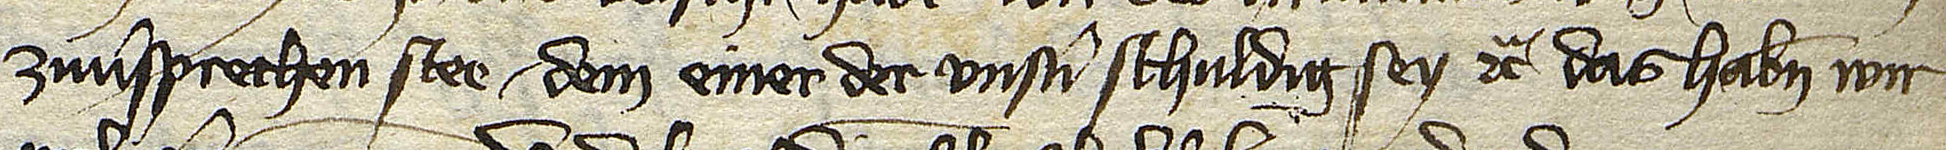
ʒuu*ſprechen ſtee / dem einer der vnſn* ſchuldig ſey ec* das habn* wir
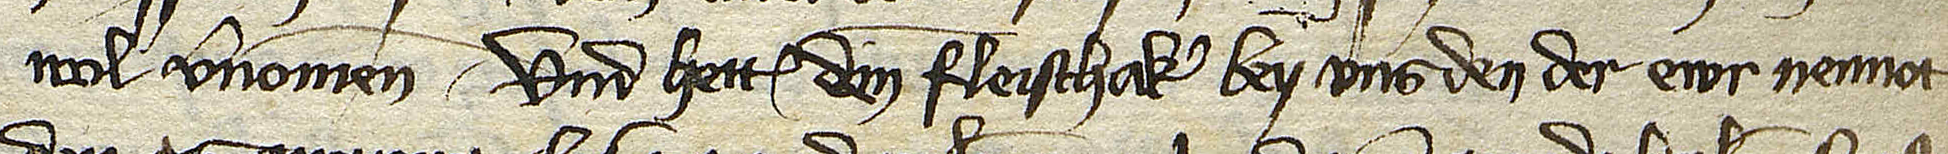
wol v*nom*en / Vnd hett* den fleiſchak* bey vns den der ewr nennet
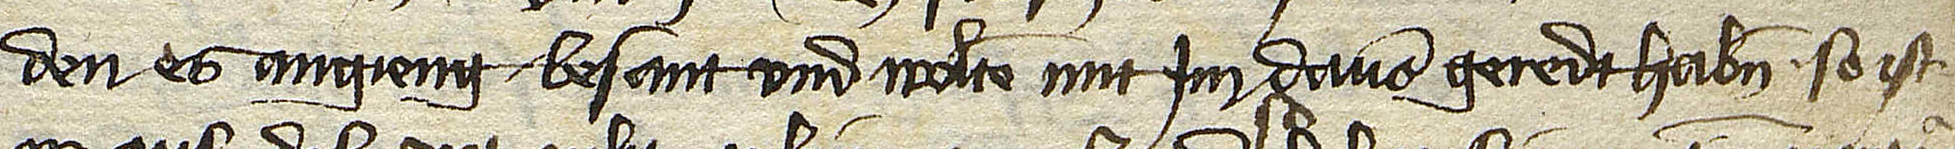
den es angieng* / beſant vnd wolte* mit Im dauo* geredt habn* . ſo iſt
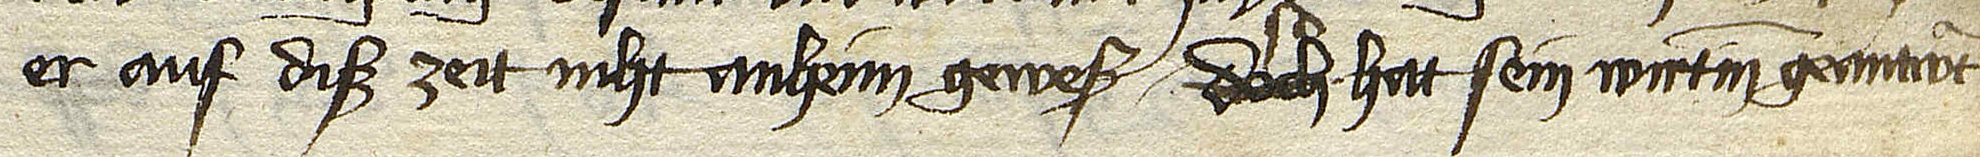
er auf diſʒ ʒeit niht anheim geweſ* / Doch hat ſein wirtin* geantw*t
